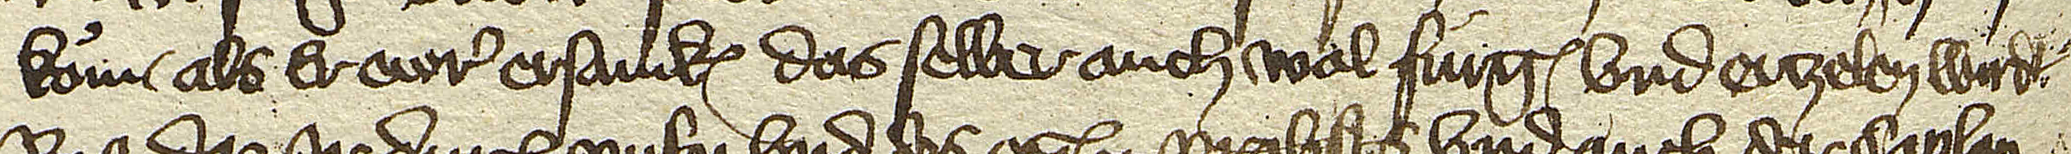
köm / als Er ewr* erſamk* das ſelber auch wol fürg* vnd ercʒelen wirdt
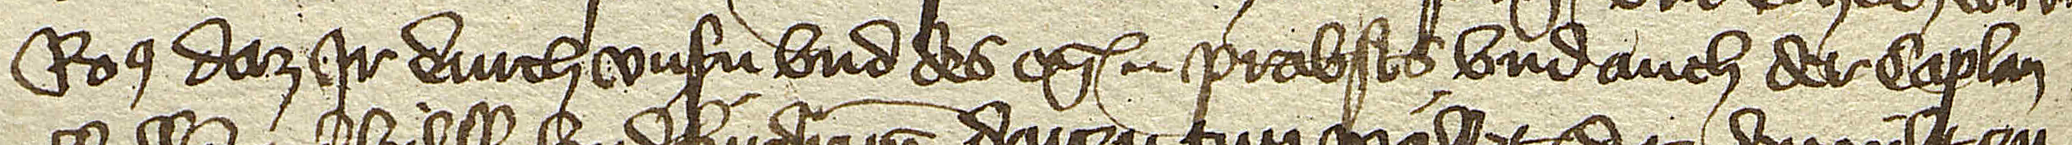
Ro* daʒ Ir durch vnſ*n vnd des eg* ~ probſts vnd auch der Caplan
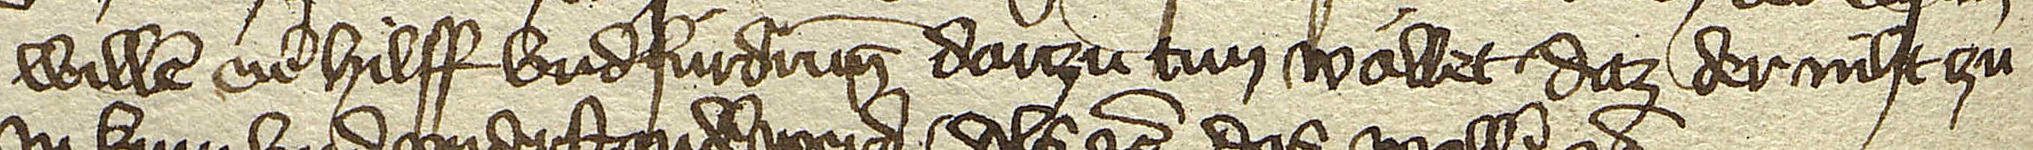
wille* ew* hilff vnd fürdrug* darcʒu tun wöllet / daʒ der niht cʒu
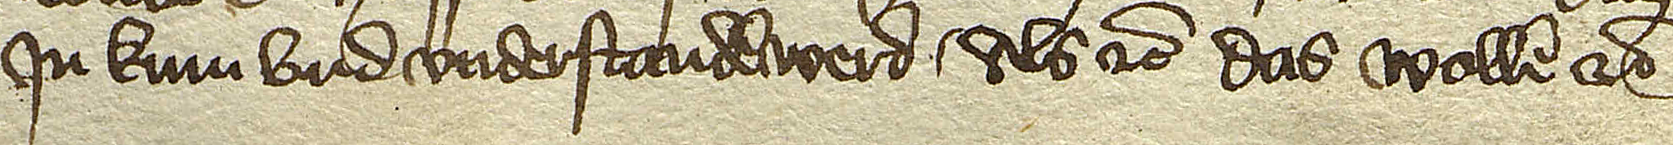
In kum vnd vnderſtande* werd / Als ec* das wolle* ec*
